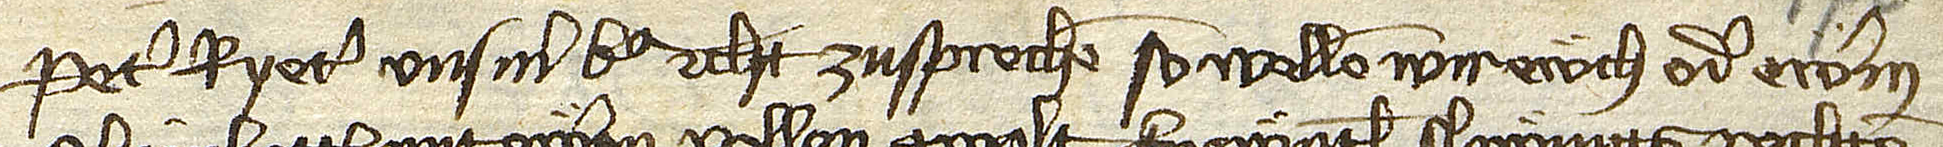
Pet* Ryet* vnſ*m b* icht ʒuſpreche* ſo welle* wir ewch od* ew*n
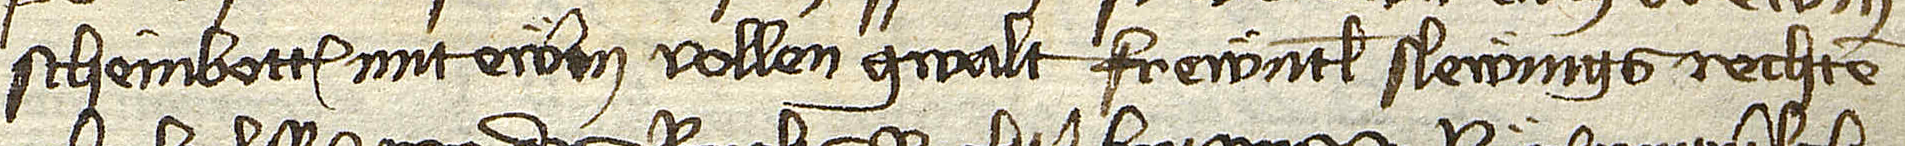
ſcheinbott* mit ew*m vollen gwalt frewntl* ſlewnigs rechte*
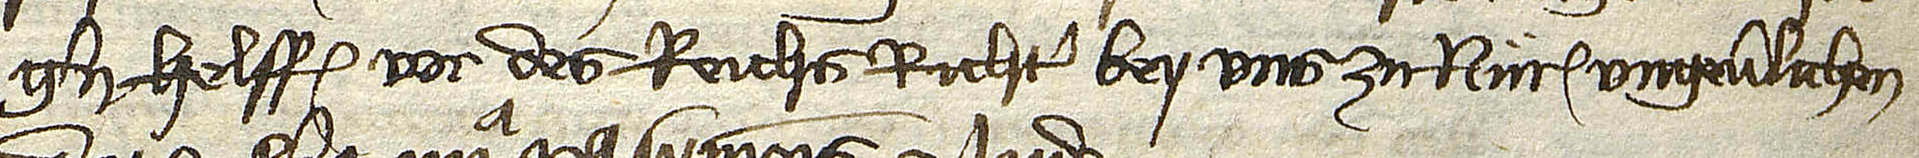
g*n helff* vor des Reichs Richt* bey vns ʒu Nür* vngeu*lichen
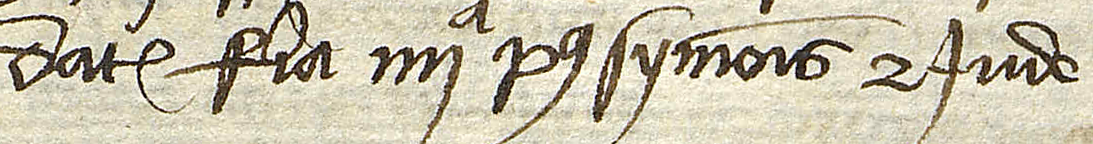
Dat* fia* iiii* p* ſymo*is @ Iude
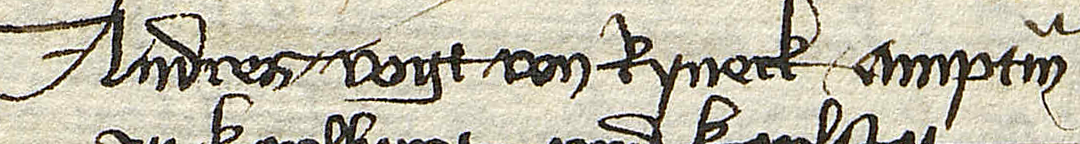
Andres vogt von Ryneck amptm*
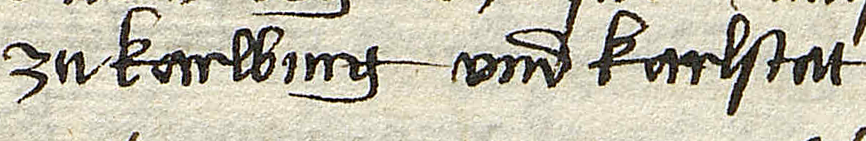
ʒu karlburg vnd karlſtat
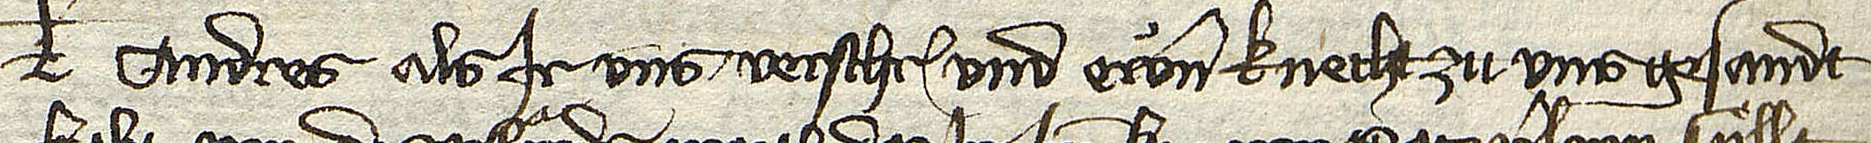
L* Andres als Ir vns verſchr* vnd ew*n knecht ʒu vns geſandt
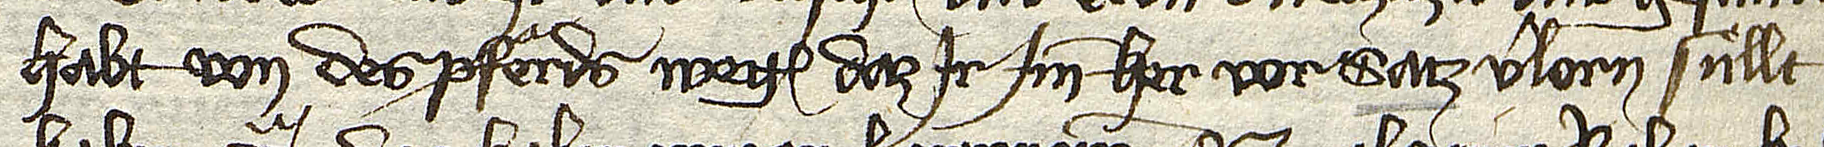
habt von des pfërds weg* daʒ Ir Im* her vor Sacʒ v*lorn ſüllt
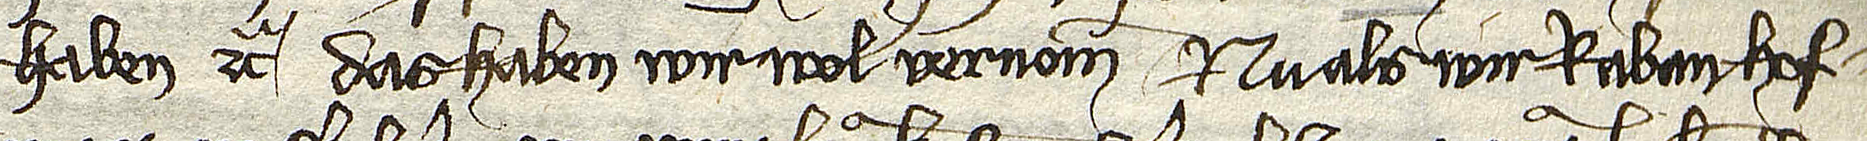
haben ec* das haben wir wol vernom* / Nu als wir Raban hof =
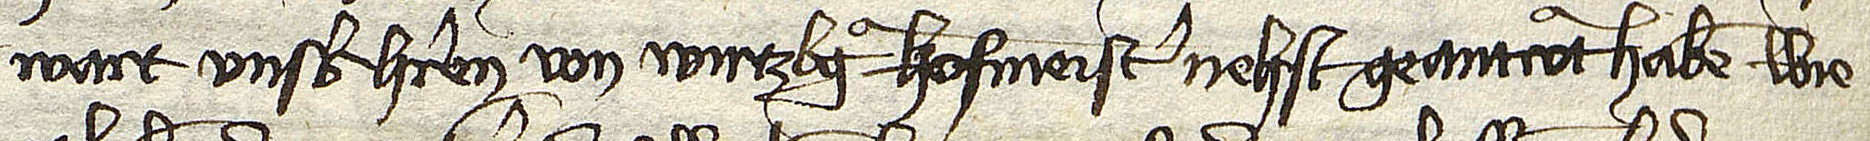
wart vnſ*s h*ren von wircʒb*g hofmeiſt*r nehſt geantw*t habe* . Wie
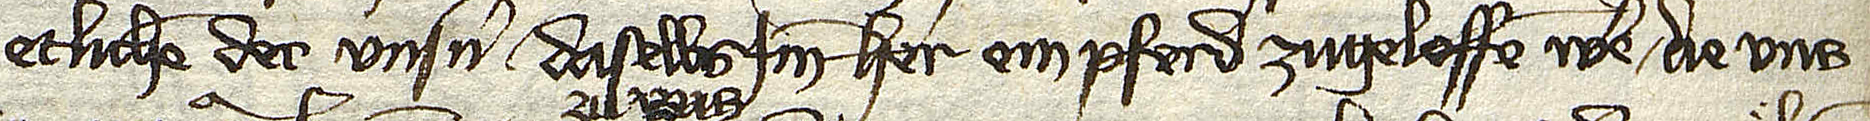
etliche* der vnſ*n / daſelbs Im* her ein pferd ʒugeloffe* we* / die vns
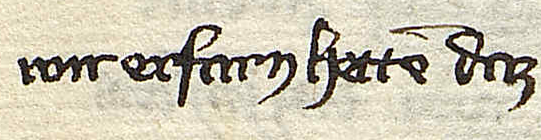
wir erfarn hette* daʒ
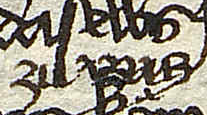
ʒu vns
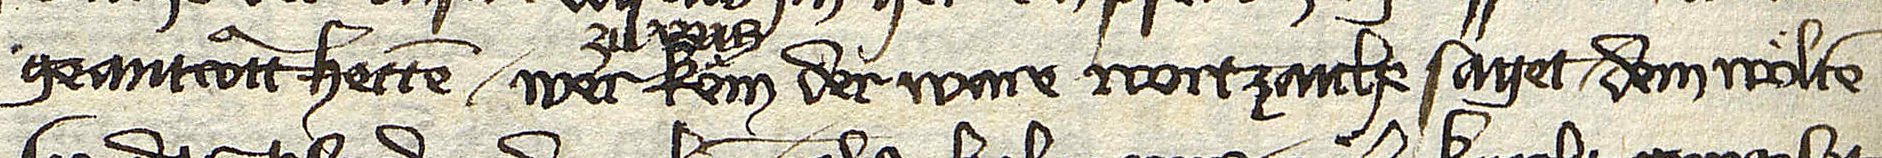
geantw*tt hette* / wer këm der ware wortʒaiche ſaget / Dem wölte*
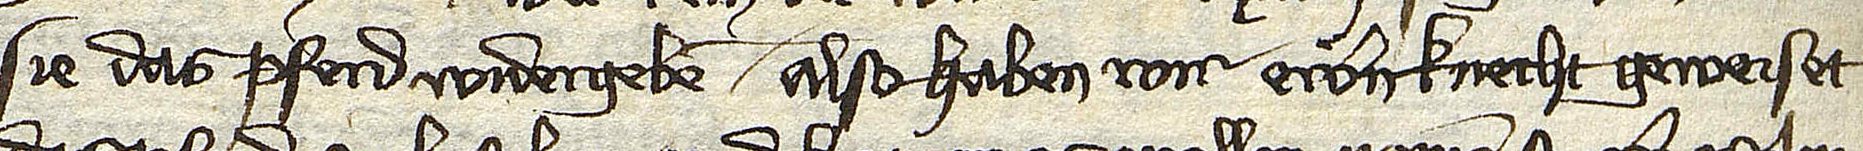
ſie das pferd widergebe* / Alſo haben wir ew*n knecht geweiſet
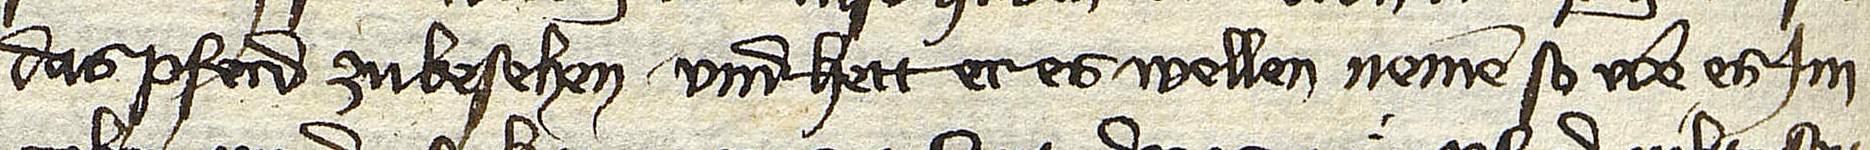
das pferd ʒubeſehen / vnd hett er es wellen neme* ſo we* es Im
